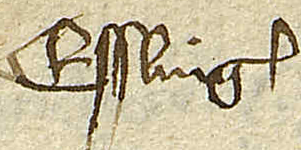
Eſſling*
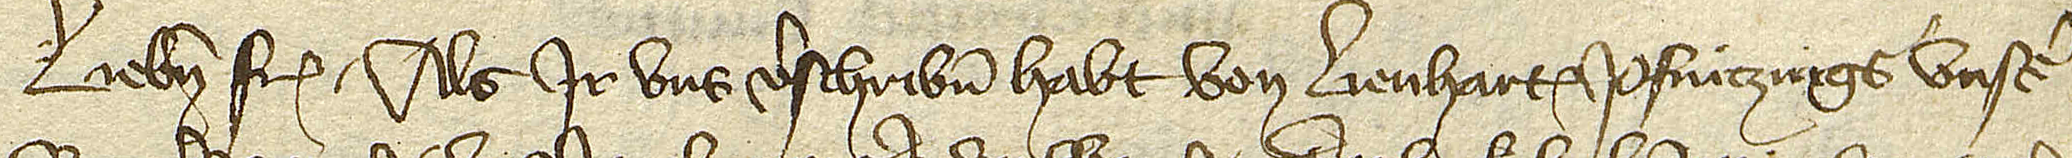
Lieb*n fr* / Als Ir vns v*ſchribn* habt von Lienhart* Pfincʒnigs* vnſs*
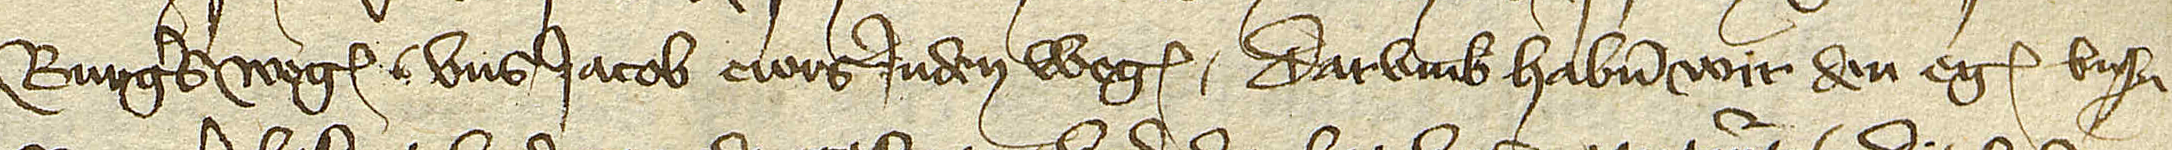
Burg*s wege* / vns Iacob ewrs Iudem weg* / Darvmb habn* wir den eg* vnſn*
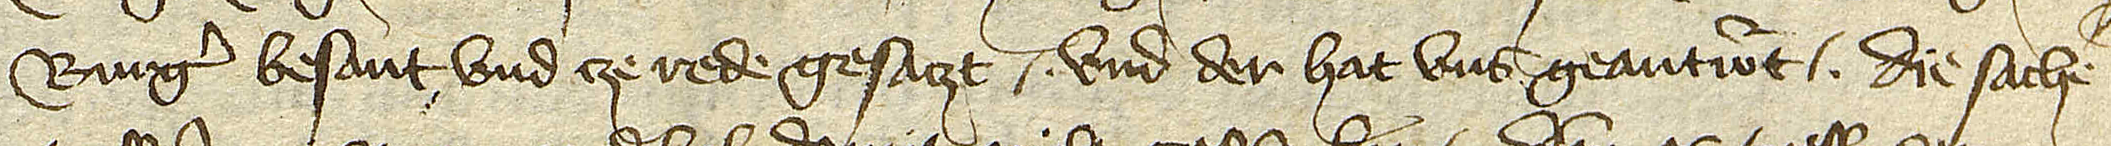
Burg* beſant vnd cʒe rede geſacʒt / . vnd der hat vns geantw*t / . die ſache
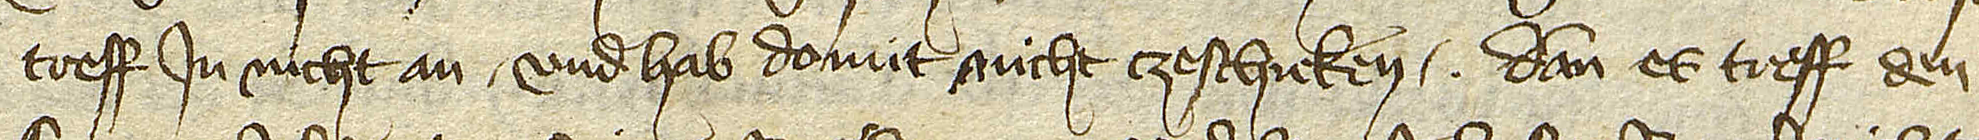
treff In nicht an / vnd hab domit nicht cʒeſchicken / . dan* es treff den
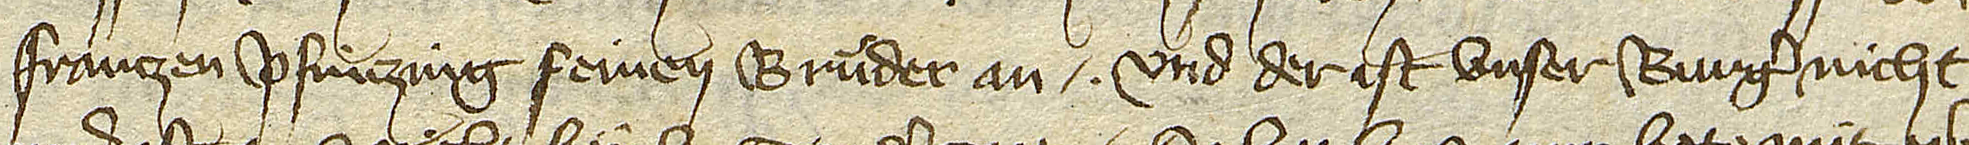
Francʒen Pfincʒnig ſeinen Brüder an / . vnd der iſt vnſer Burg* nicht
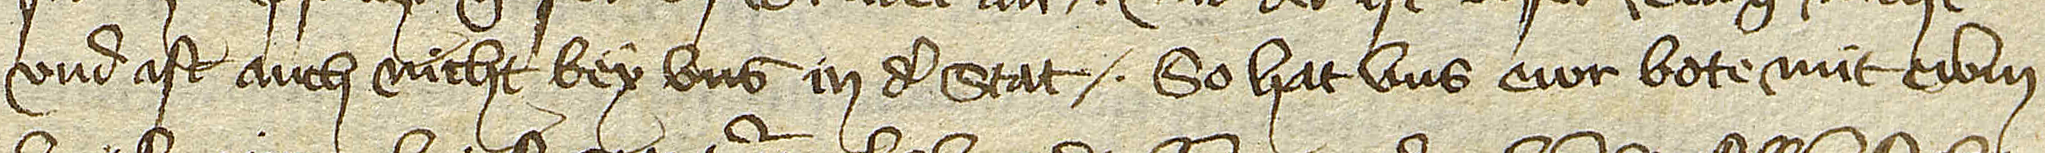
vnd iſt auch nicht bey vns in d* Stat / . So hat vns ewr bote mit ew*n
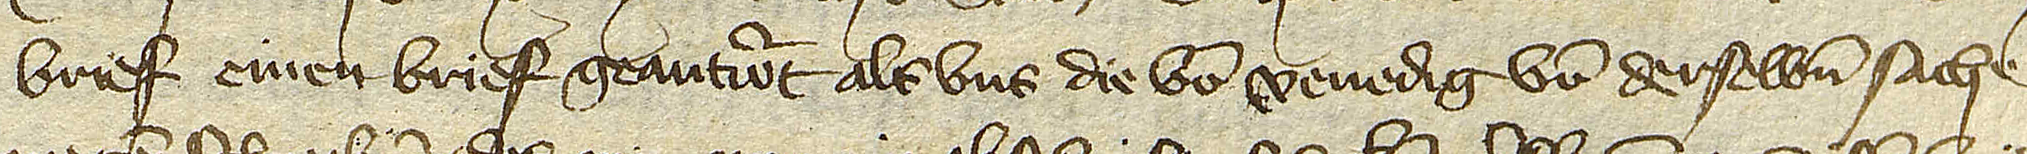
brief einen brief geantw*t als vns die vo* venedig vo* derſelbn* ſache
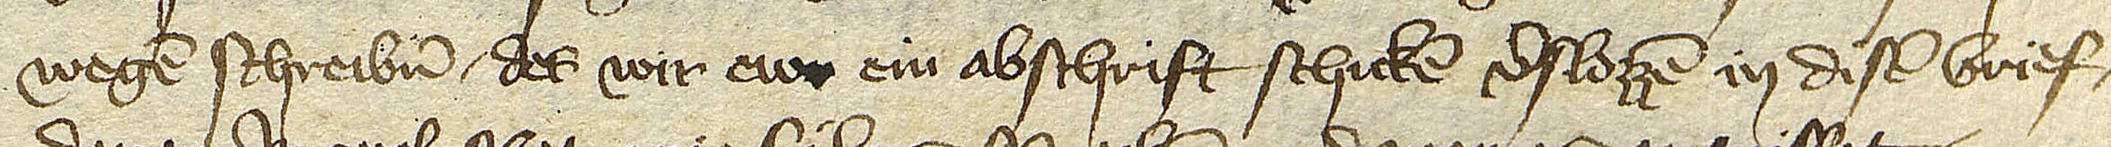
wege* ſchreibn* / des wir ewr ein abſchrift ſchicke v*ſloʒʒe* in diſe* brief /
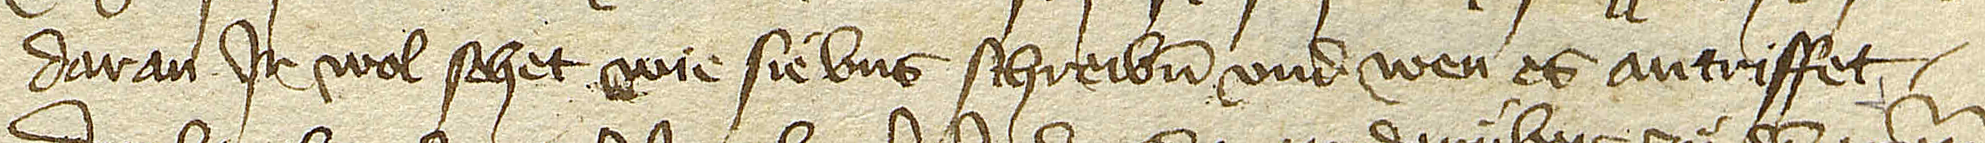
daran Ir wol ſehet wie ſie vns ſchreibn* vnd wen es antriffet /
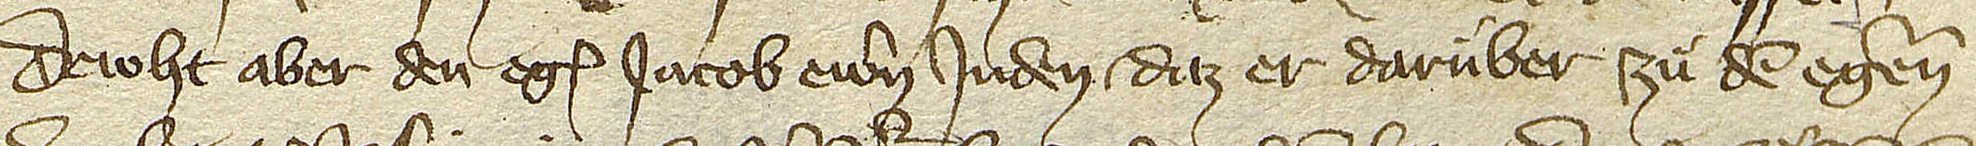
Dewht aber den eg* Iacob ew*n Iuden / daʒ er darüber cʒü d* egen*
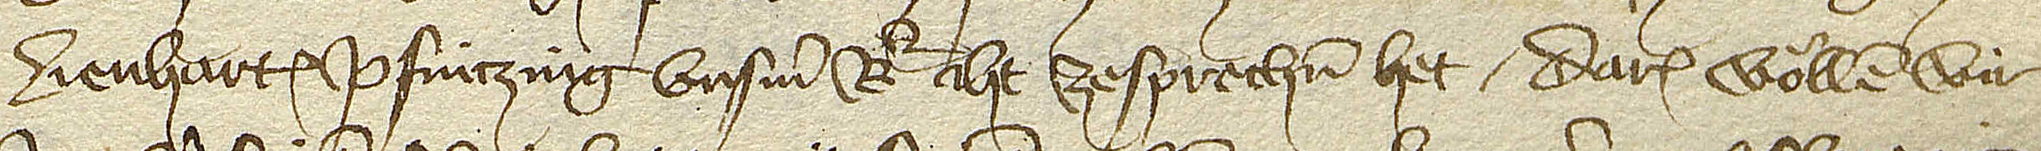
Lienhart* Pfincʒing vnſm* B* iht cʒeſprechn* het / Dar* wölle wir
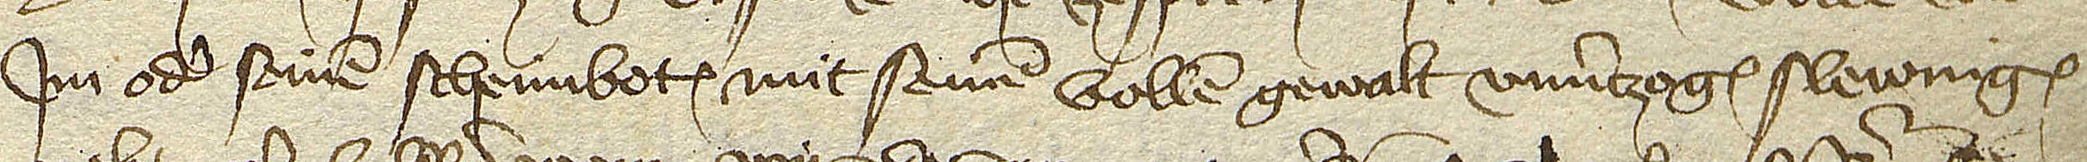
Im od* ſeine* ſcheimbot* mit ſeine* volle* gewalt vnu*cʒog* ſlewnig*
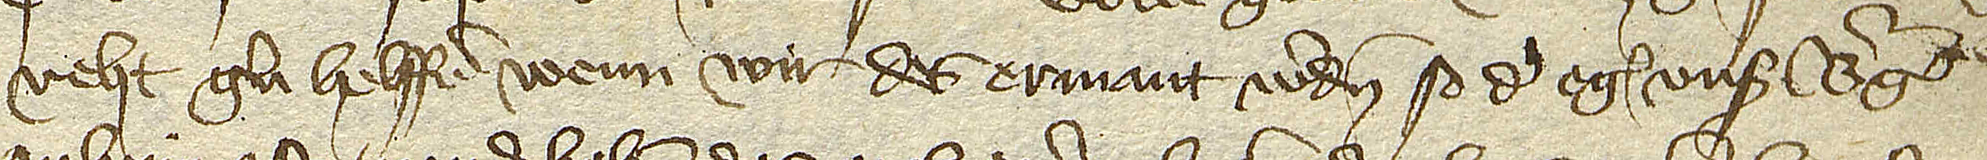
reht g*n helffe* wenn wir des ermant w*dn* ſo d* eg* vnſ* B*g*
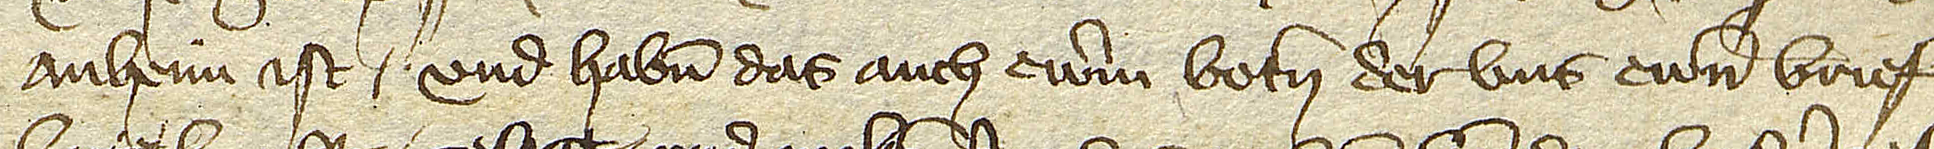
anheim iſt / . vnd habn* das auch ewm* bot*n der vns ewn* brief
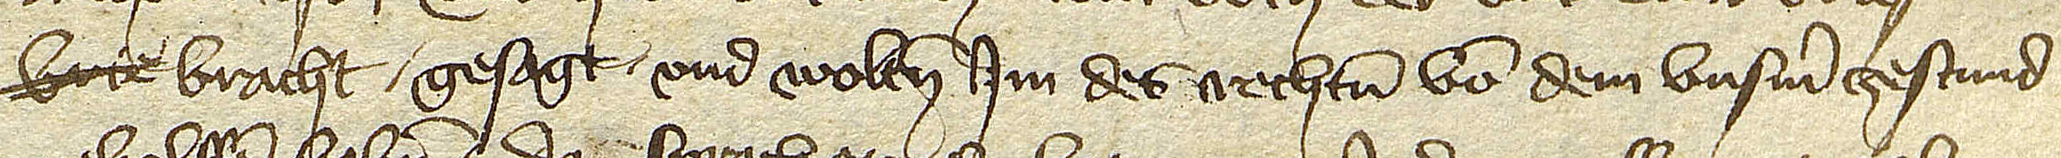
brie bracht / geſagt / vnd woltn* Im des rechtn* vo* dem vnſm* cʒeſtund
